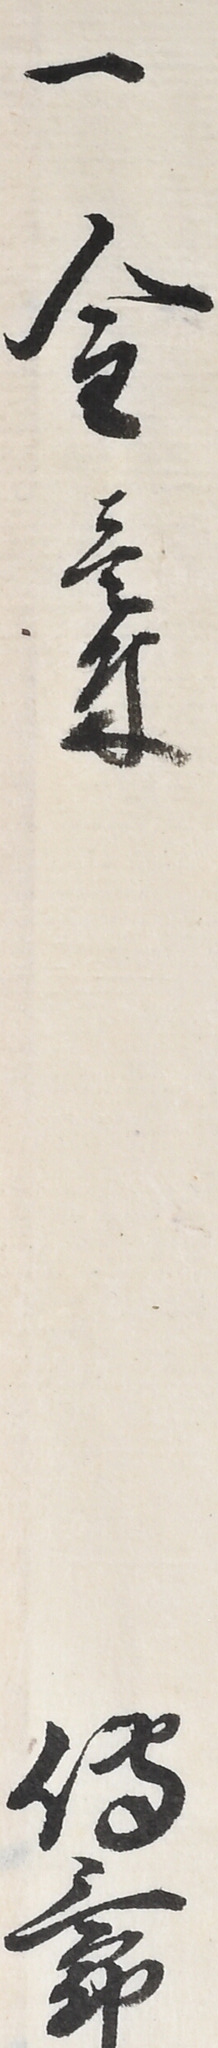一金壱朱伝三郎
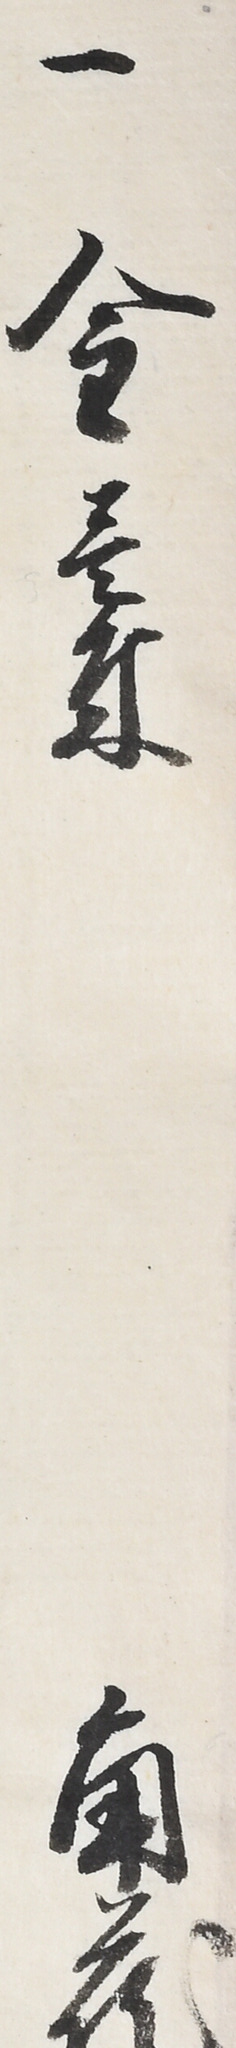一金壱朱角蔵
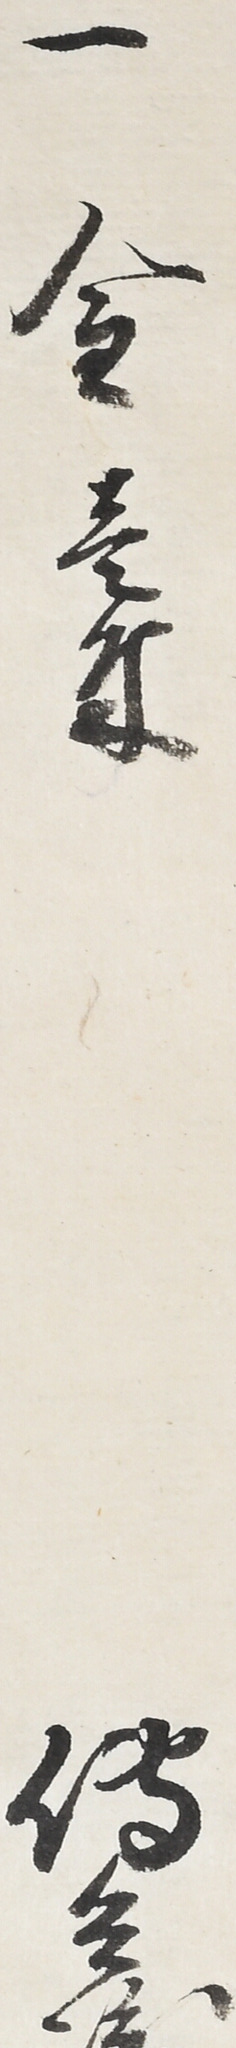一金壱朱伝兵衛
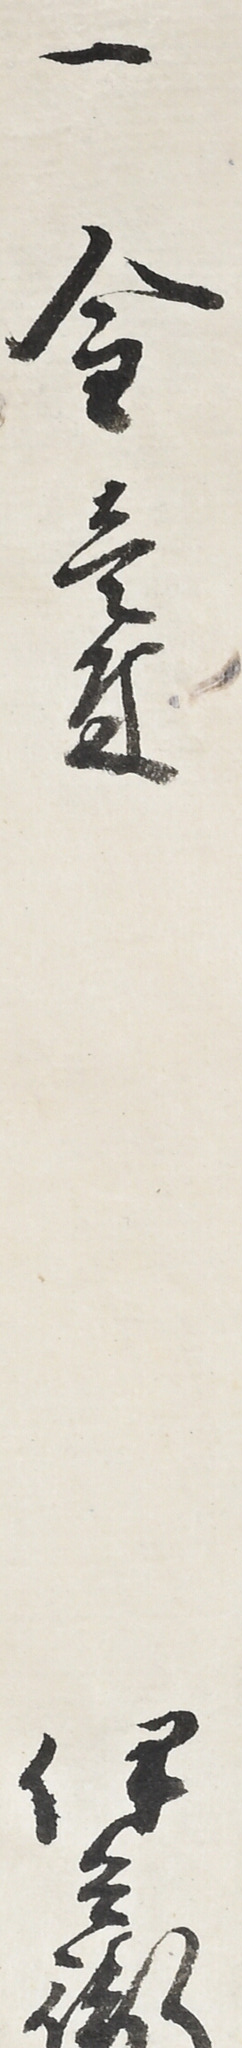一金壱朱伊兵衛
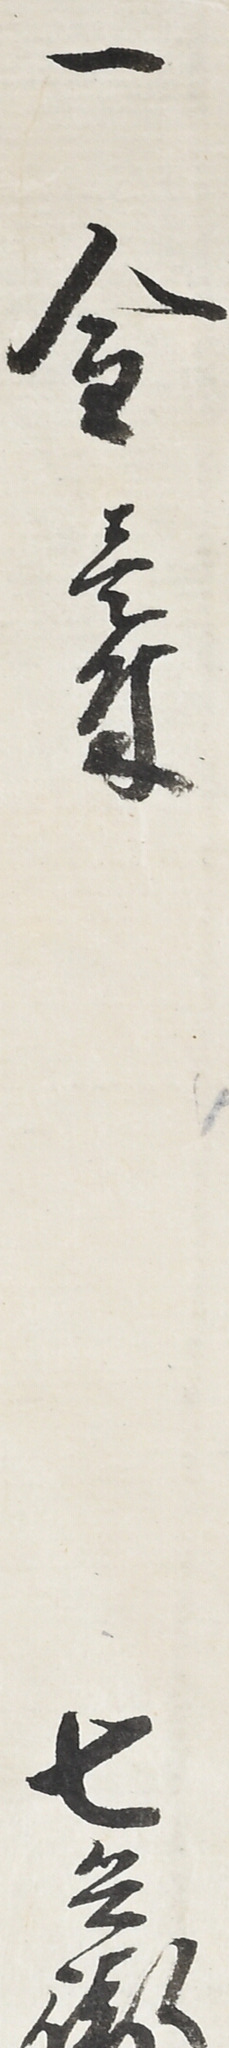一金壱朱七兵衛
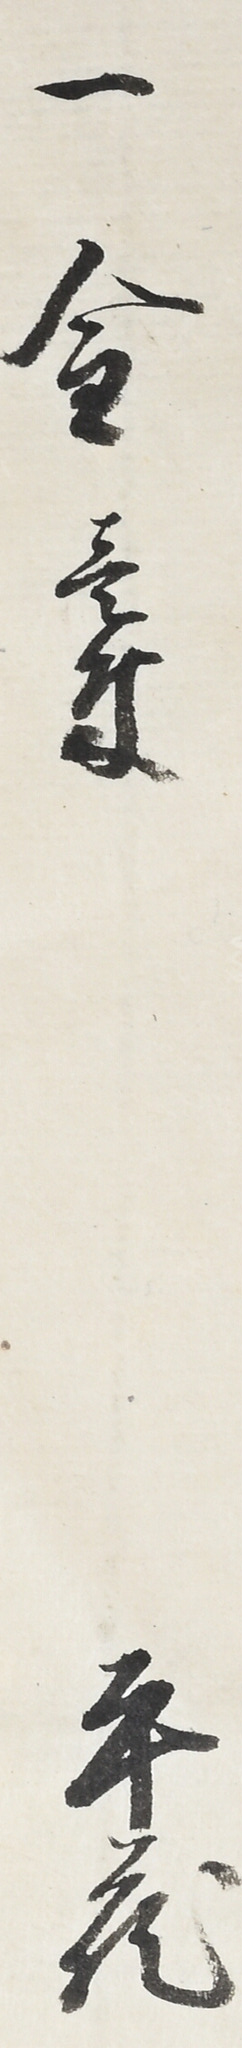一金壱朱平蔵

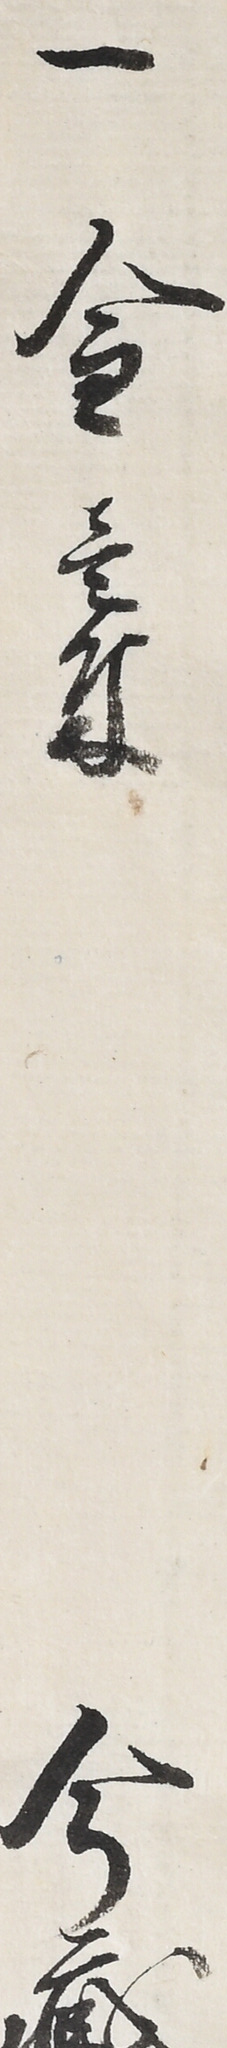一金壱朱今蔵
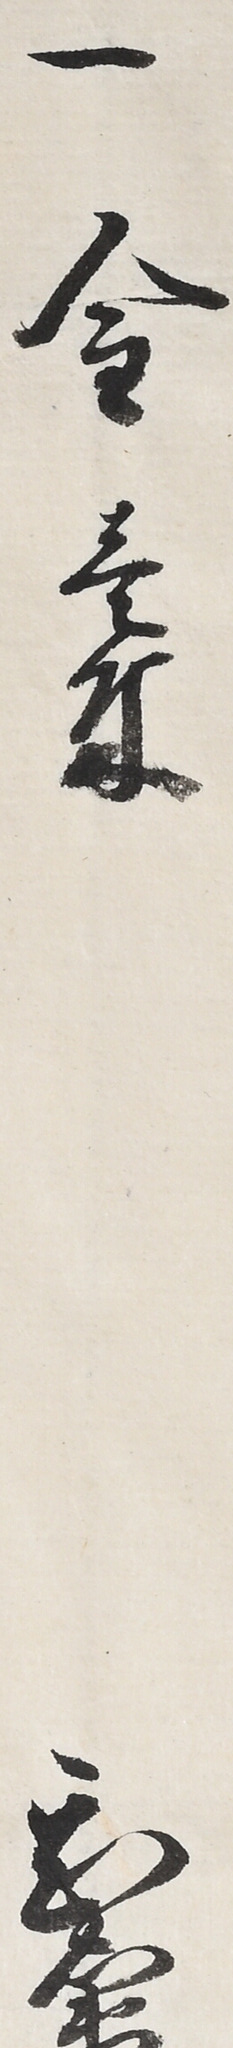一金壱朱今蔵
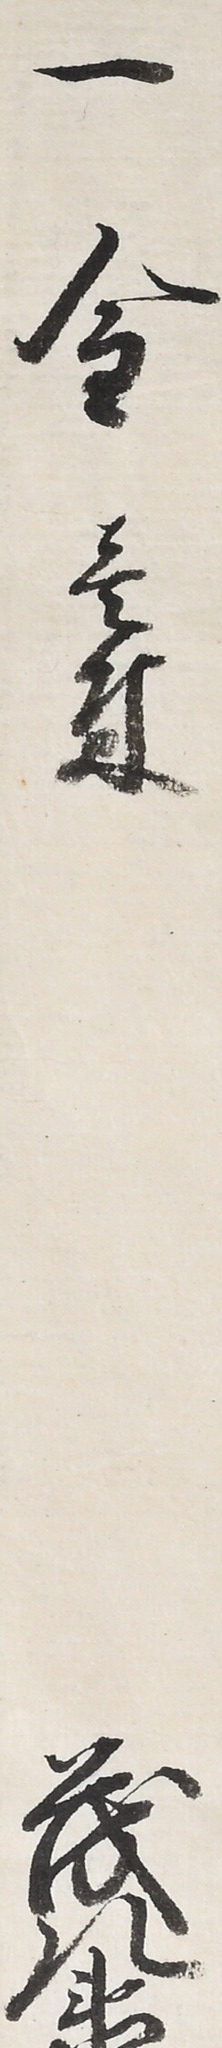一金壱朱茂左衛門
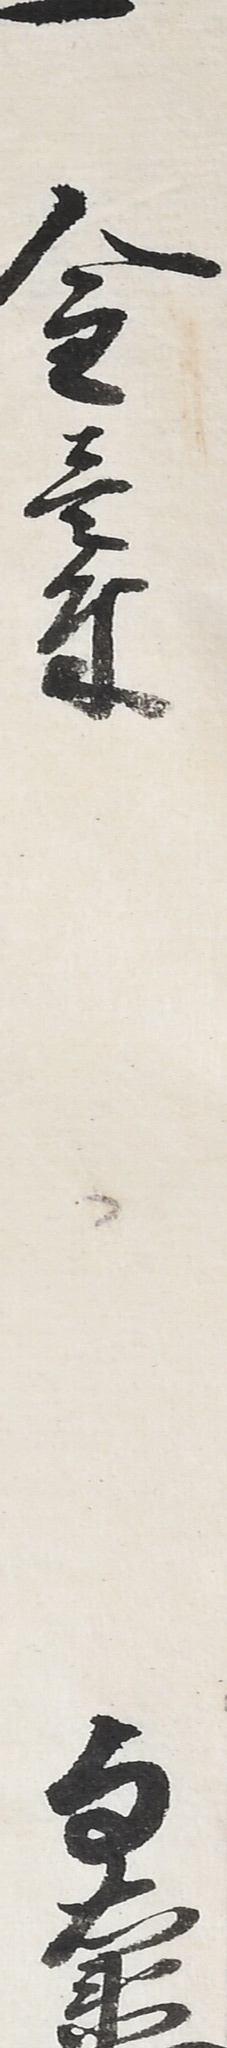一金壱朱与右衛門
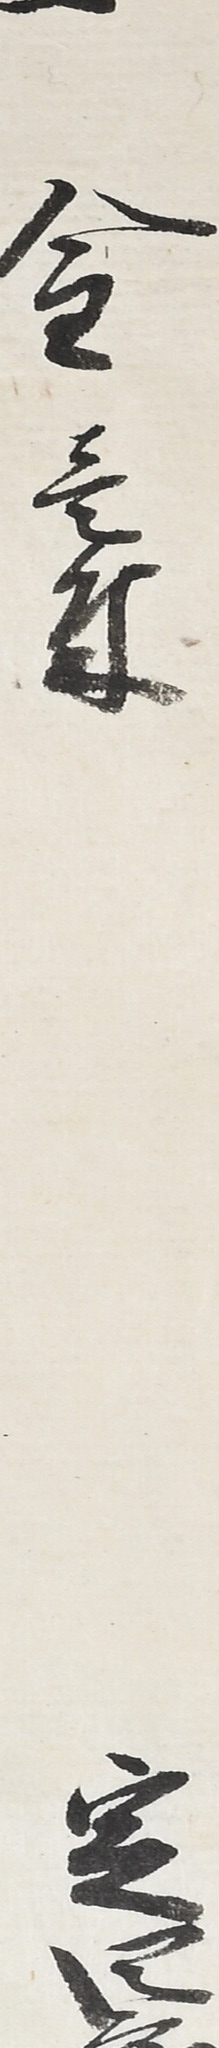一金壱朱定四郎

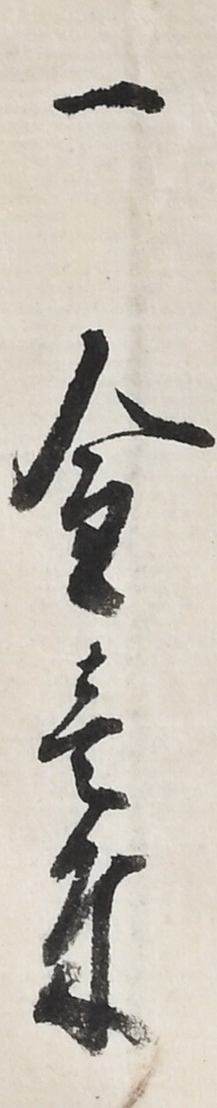一金壱朱
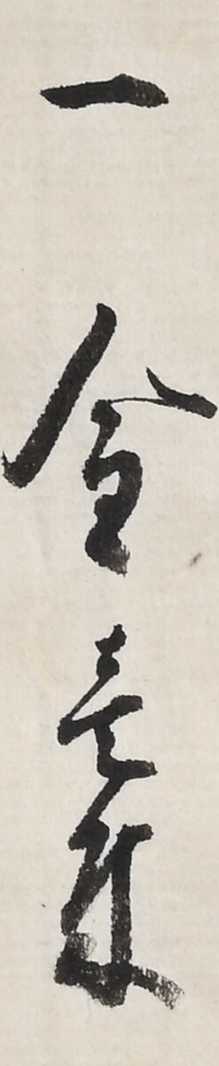一金壱朱
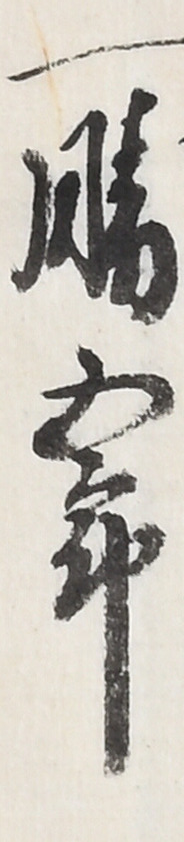勝五郎
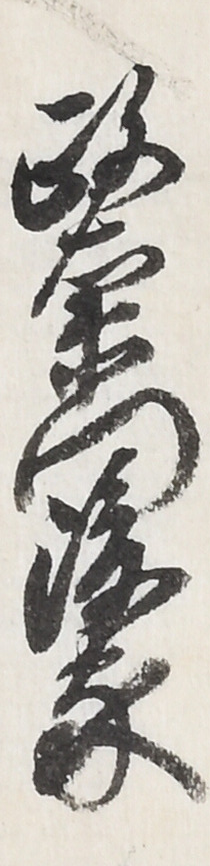政右衛門後家
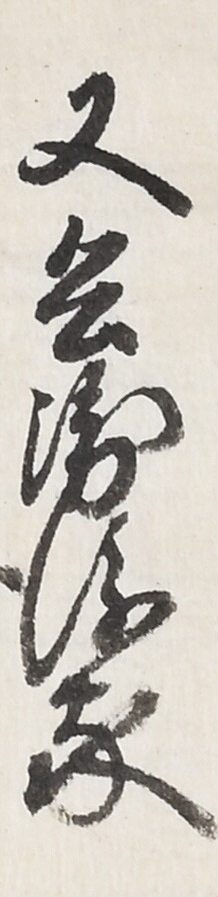又兵衛後家
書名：御拝地百五拾年御祝儀献上御目録名前
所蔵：伊那市立高遠町図書館・合同会社AMANE
